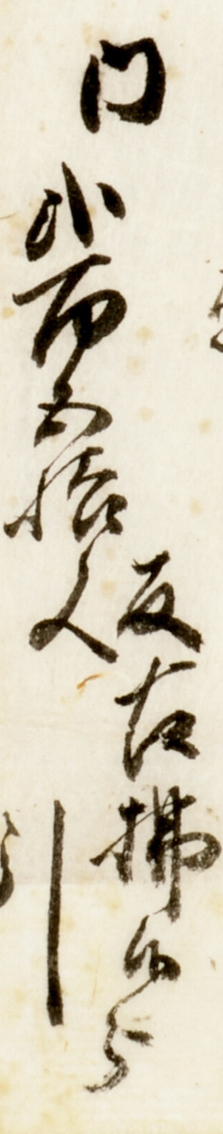内弐百五拾文引
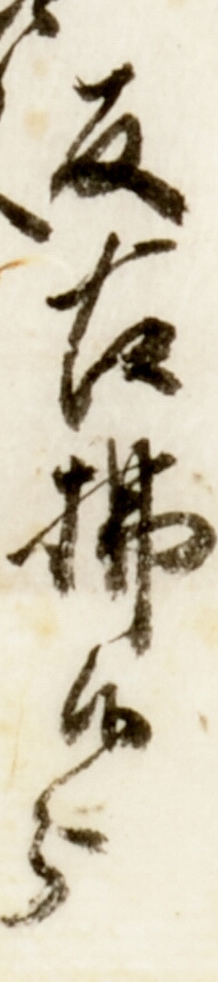反古払候分
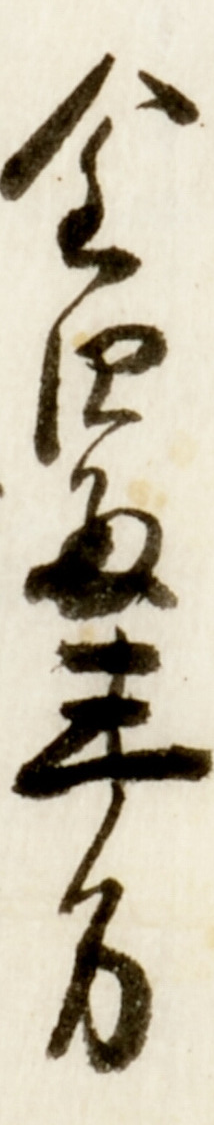金四両三分
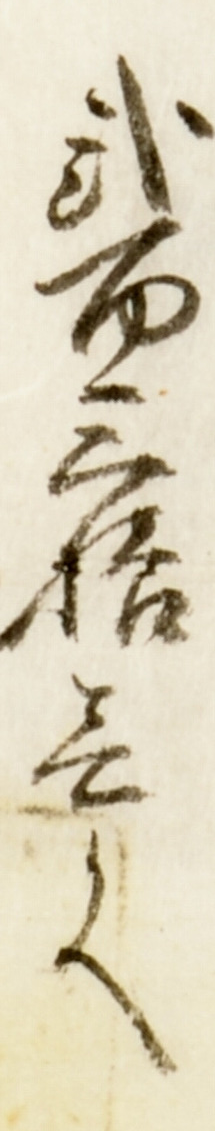弐百三拾壱文

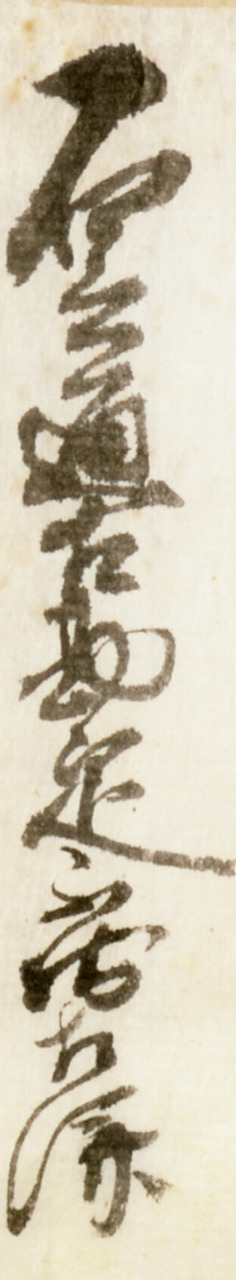右之通御勘定不残相済
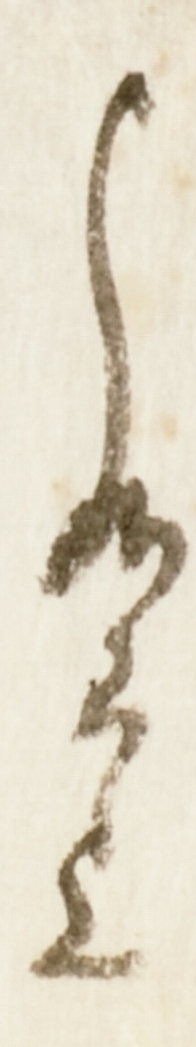申候已上
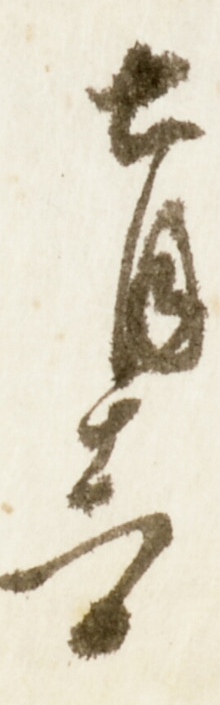七月十二日

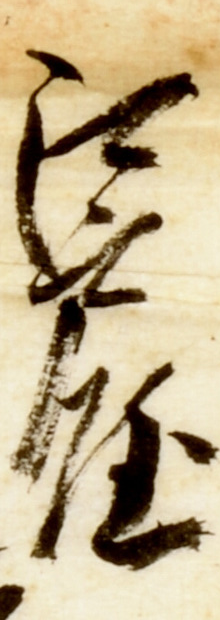江戸屋
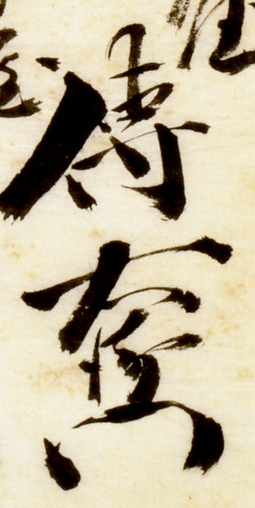傳右衛門
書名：御賄諸色控帳
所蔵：伊那市立高遠町図書館・合同会社AMANE
